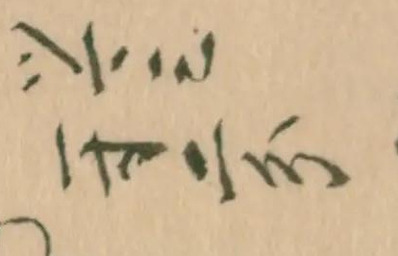一寸二分
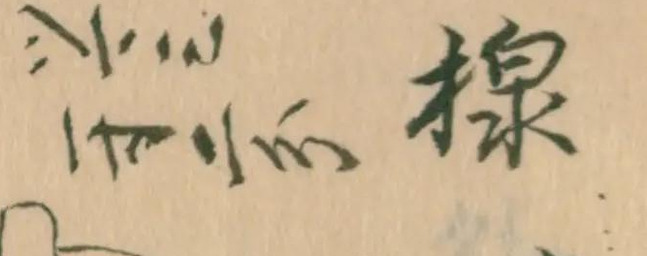一寸二分
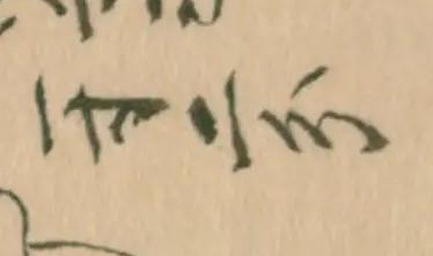一寸二分
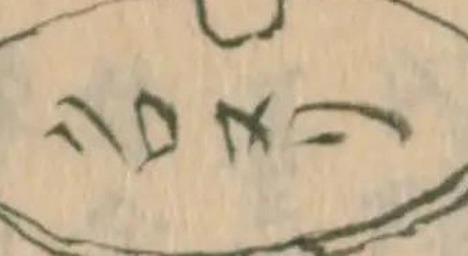クロヌリ
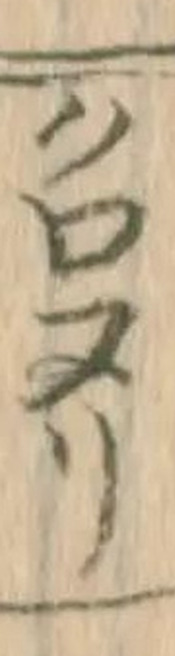クロヌリ
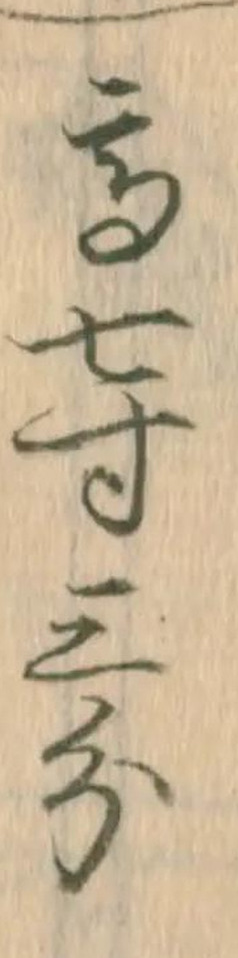高六寸九分
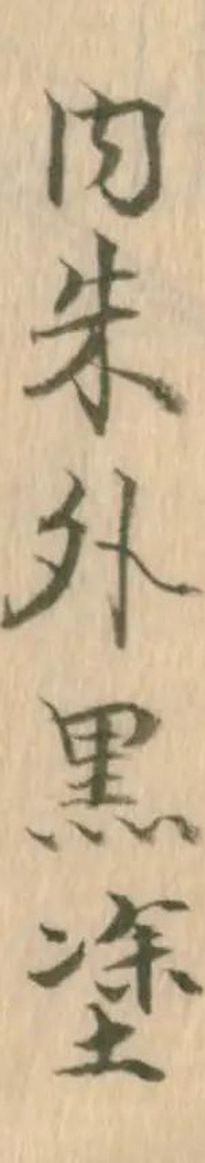内朱外黒塗
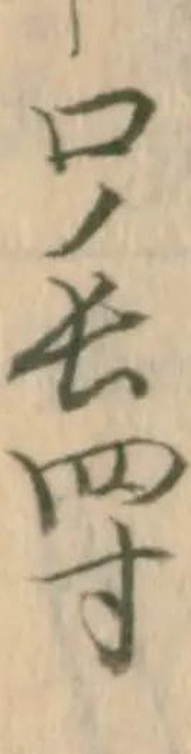口ノ長四寸
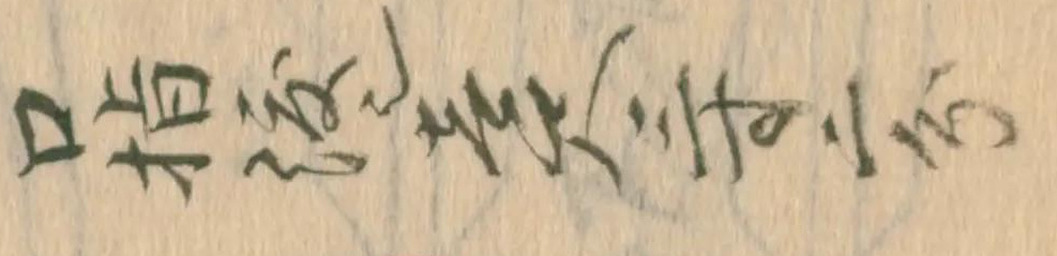口指渡シ壱尺三寸二分
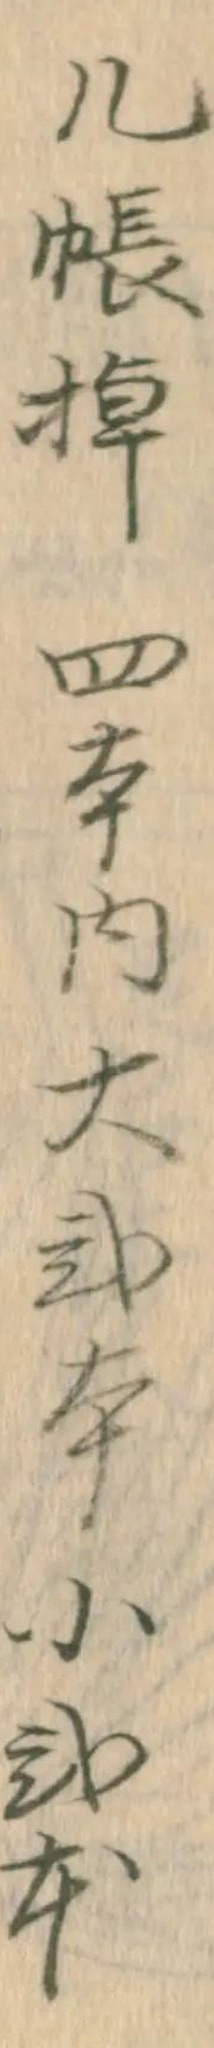几帳棹四本内大弐本小弐本
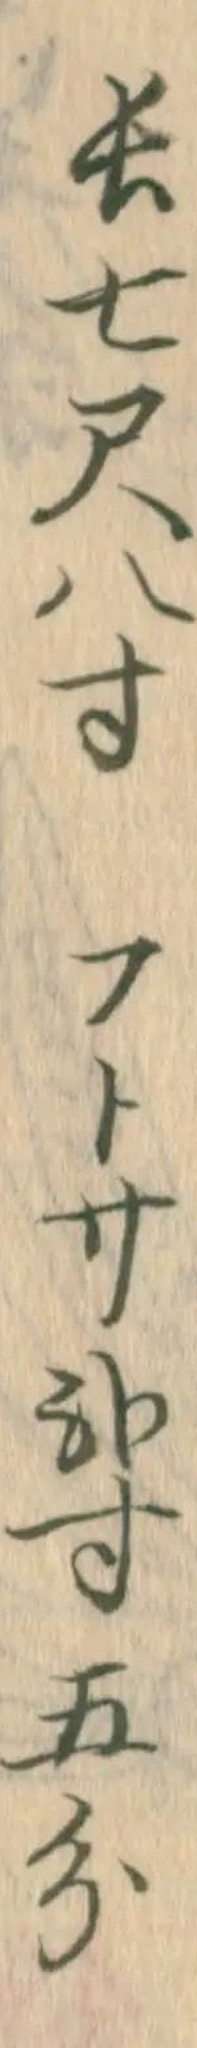長七尺八寸フトサ弐寸五分
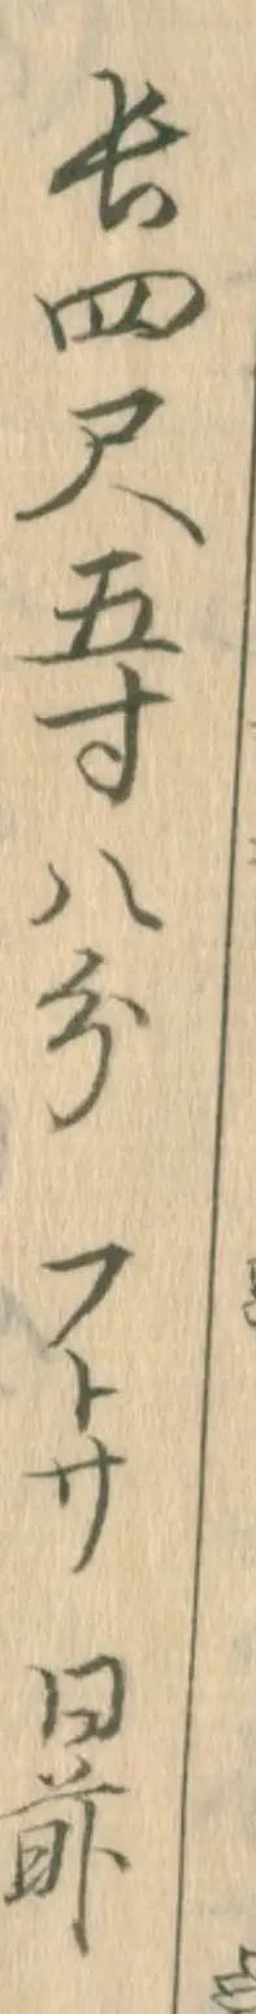長四尺五寸八分フトサ同前
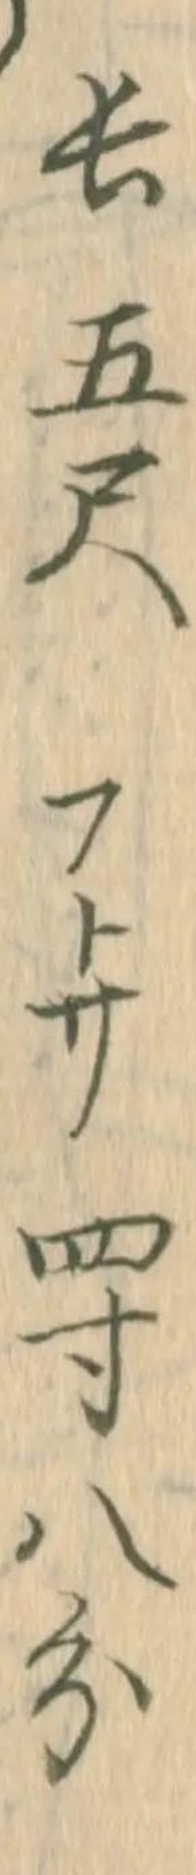長五尺フトサ四寸八分

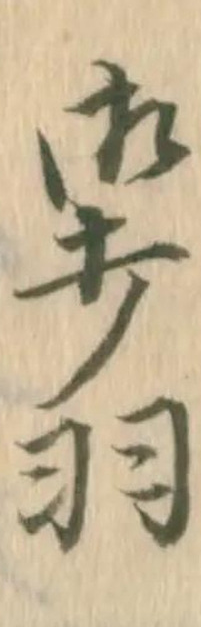御打羽
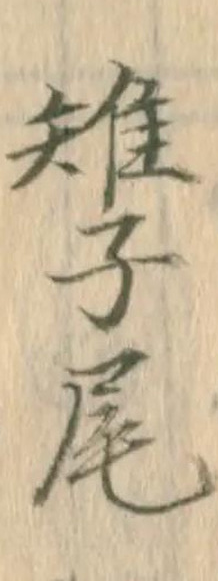雉子尾
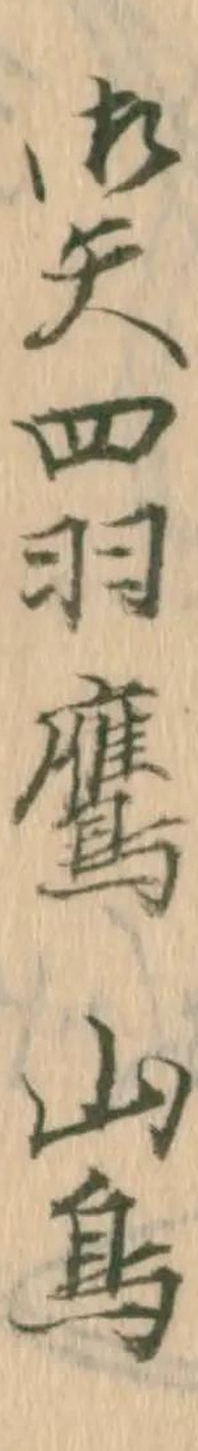御矢四羽鷹山鳥
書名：賀茂社記録. 第15冊
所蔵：国立国会図書館 National Diet Library, JAPAN
